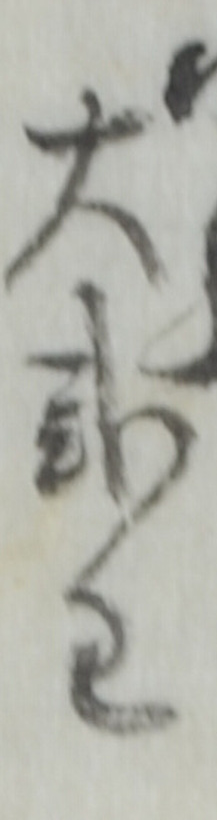大弐わ

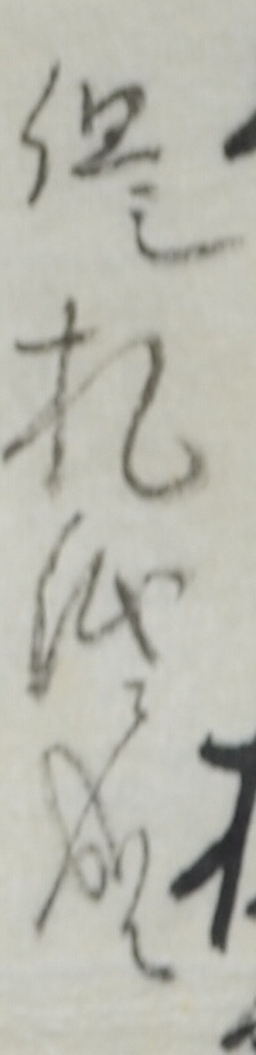但シ札紙ニ成候
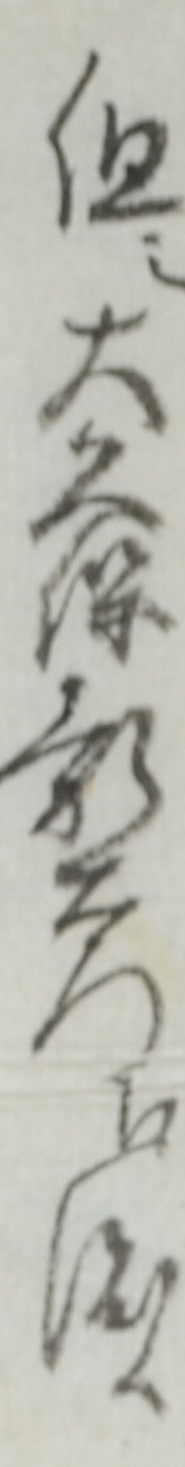但シ大久保新右衛門江渡ス
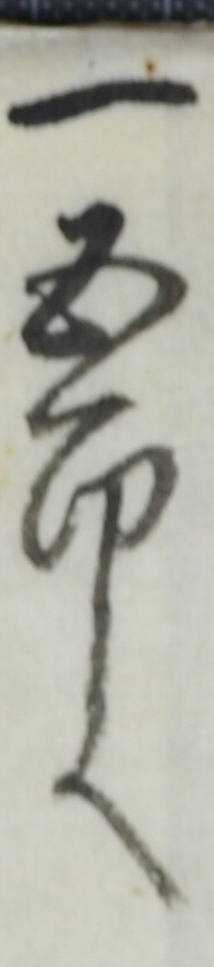一五百文
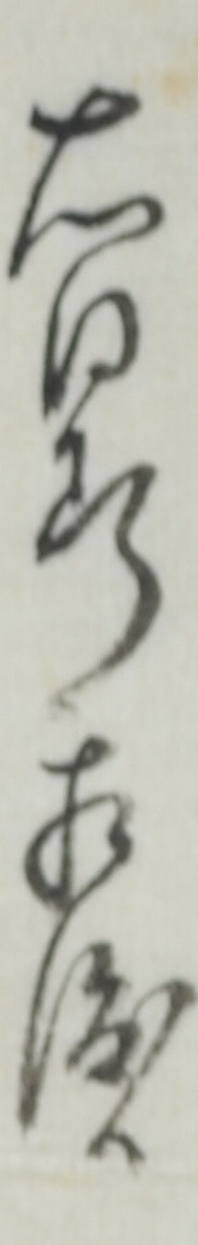右同断相渡ス
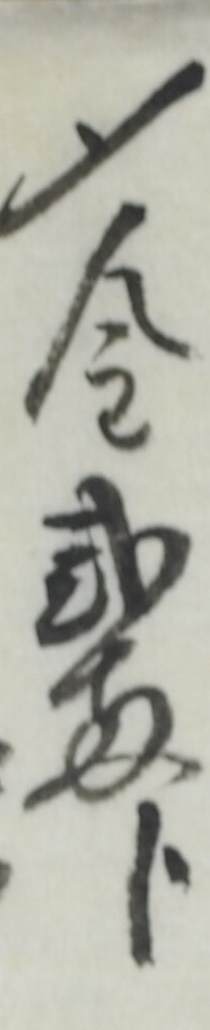〆金弐両分
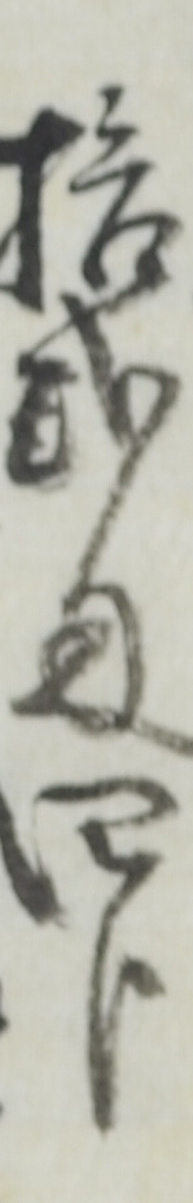拾弐匁四分
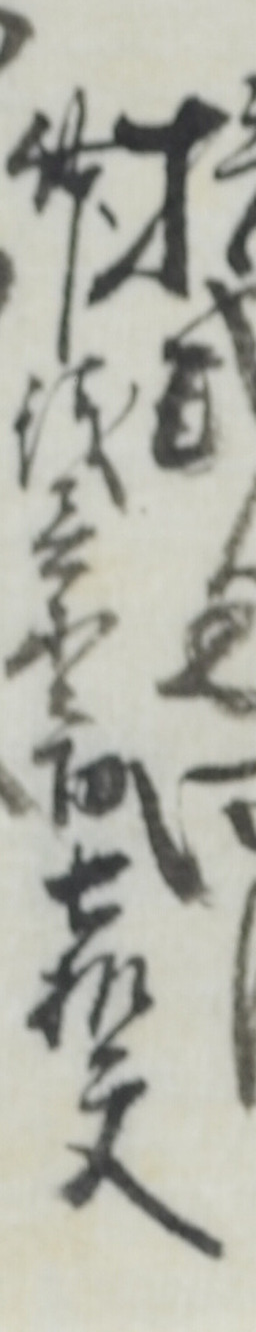此銭壱貫百七拾文
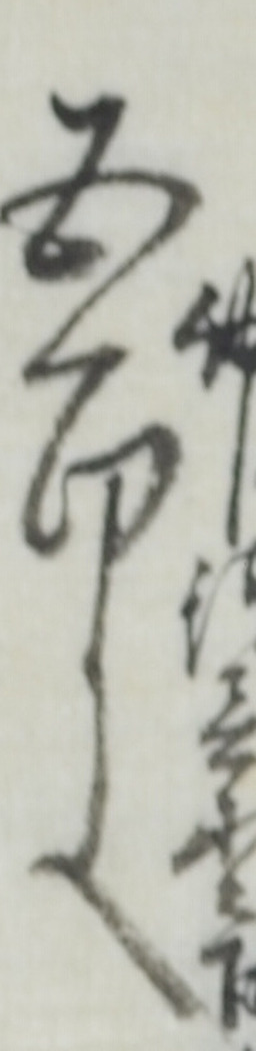五百文
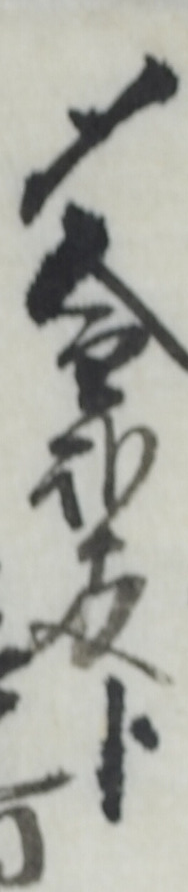〆金弐両分
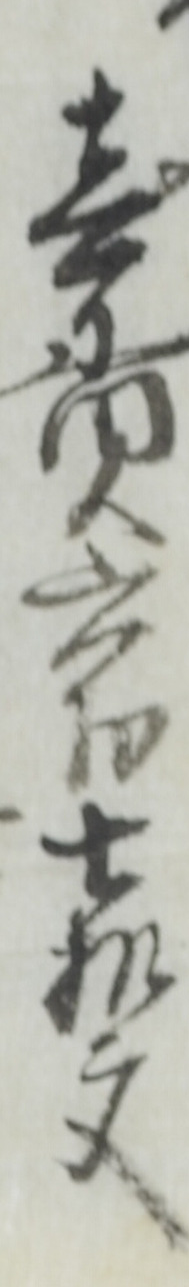壱貫六百七拾文
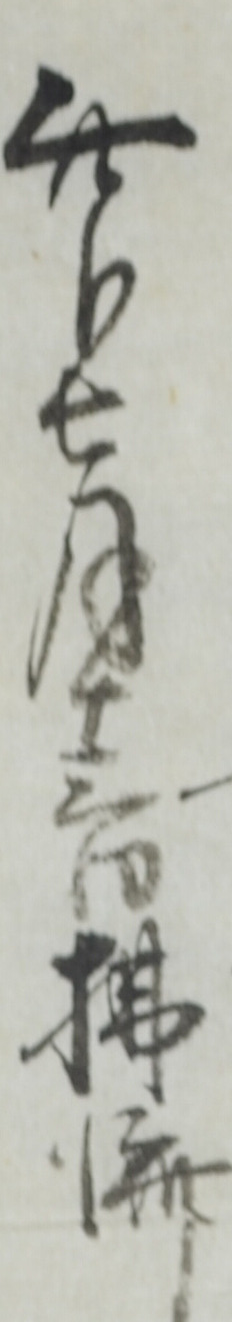此分七月十三日払済
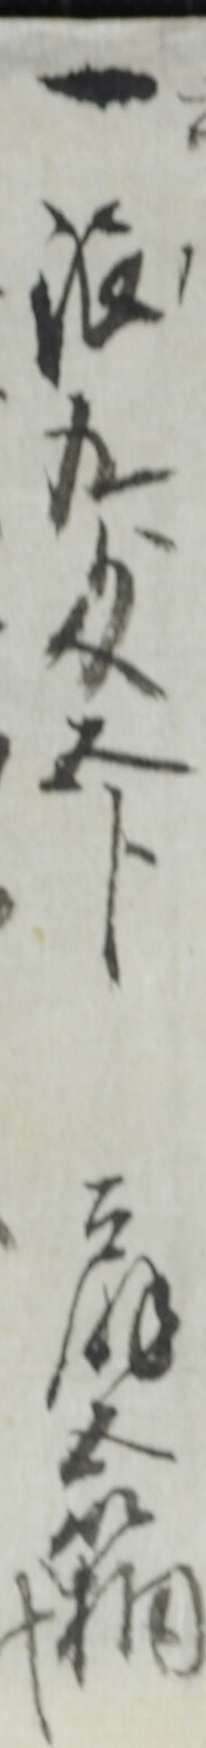一銀九匁五分扇五箱代
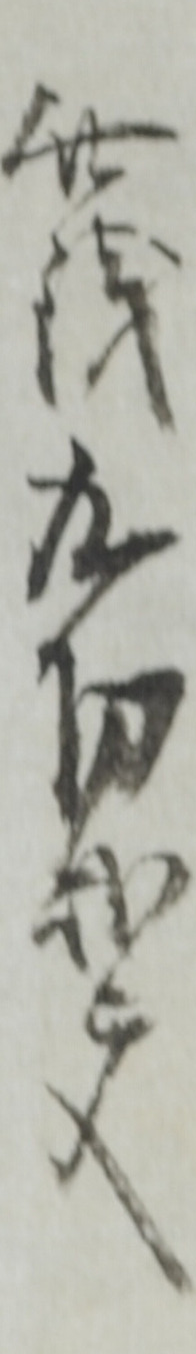此銭九百弐文

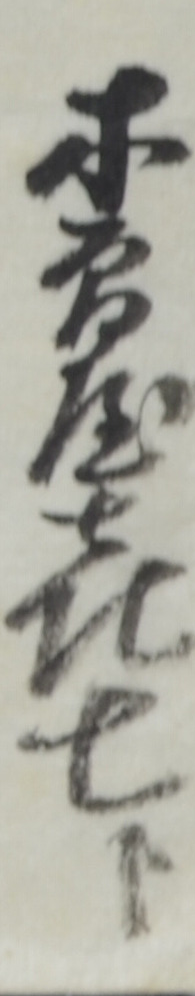木曽屋喜七分
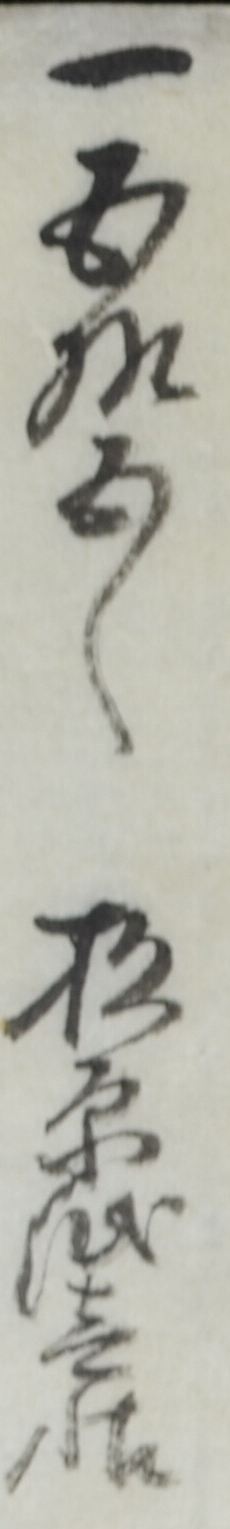一五拾五文杉原紙壱帖
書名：権現勧化入用勘定帳
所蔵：伊那市立高遠町図書館・合同会社AMANE
